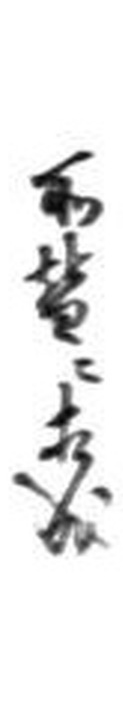所替ニ相成

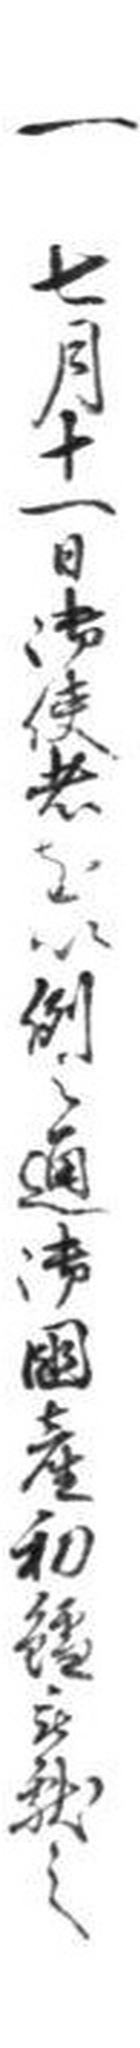一七月十一日御使者を以例之通御国産初鱈被献之
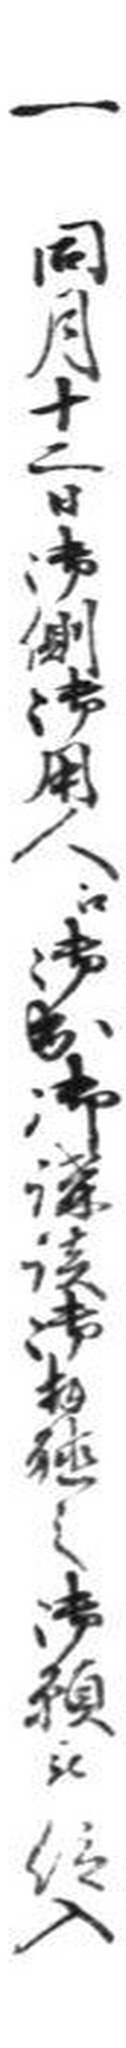一同月十二日御側御用人江御出御講読御拝聴之御願被仰入
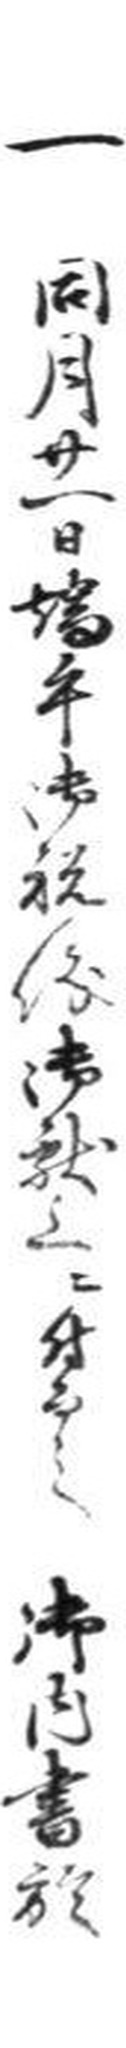一同月廿一日端午御祝儀御献上ニ付而之御内書於
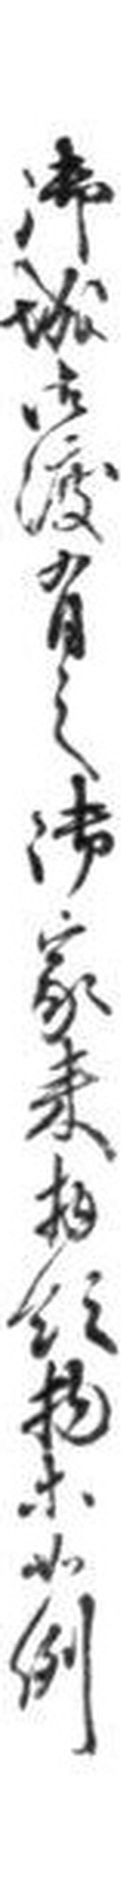御城御渡有之御家来拝領物等如例来例
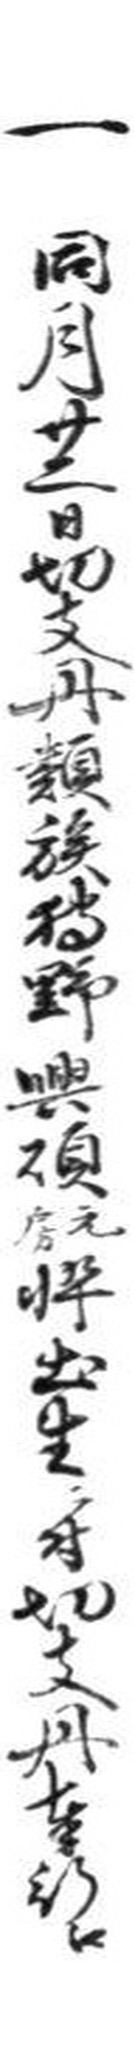一同月廿二日切支丹類族狩野興硯元房忰出生ニ付切支丹奉行江
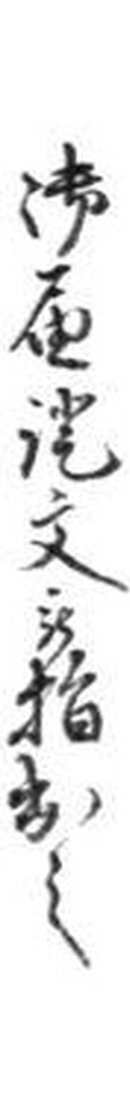御届証文被指出之
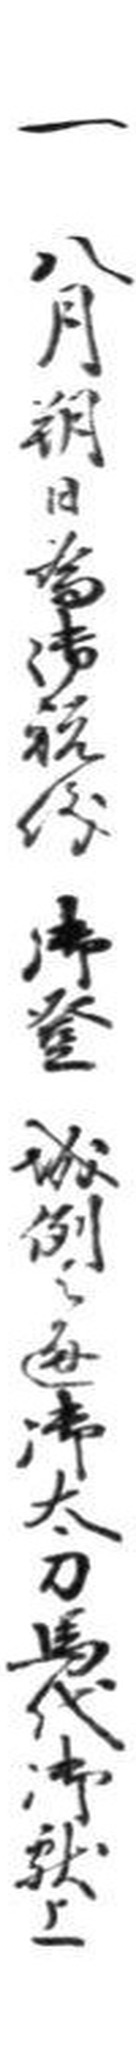一八月朔日為御祝儀御登城例之通御太刀馬代御献上
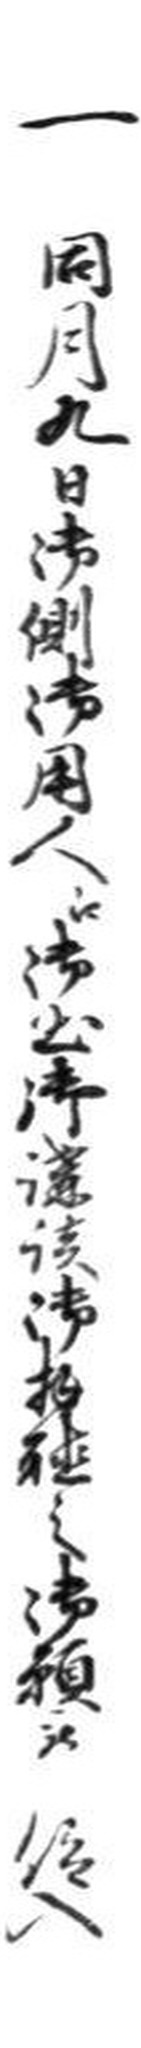一同月九日御側御用人江御出御講談御拝聴之御願被仰入
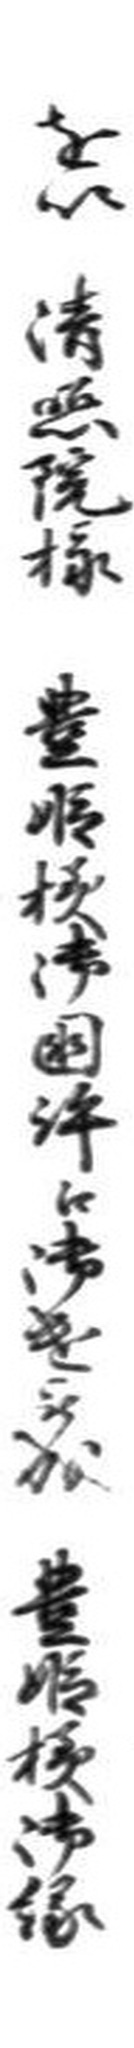を以清照院様豊姫様御国許江御遣被成豊姫様御縁
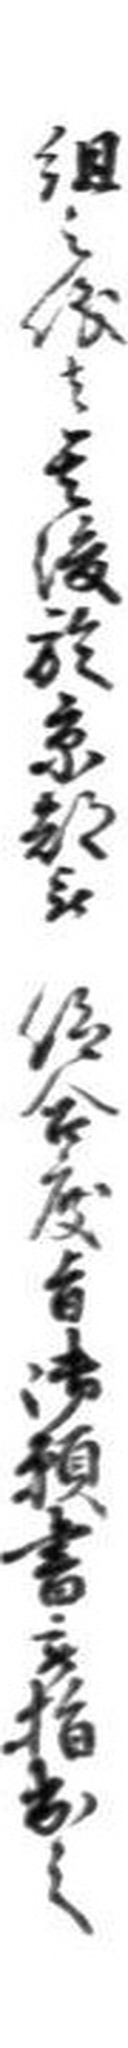組之儀者其後於京都被仰合度旨御願書被指出之
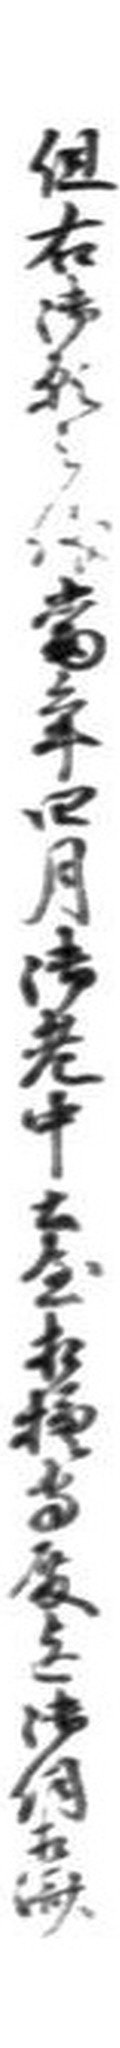但右御願之儀当年四月御老中土屋相模守殿迄御伺相済
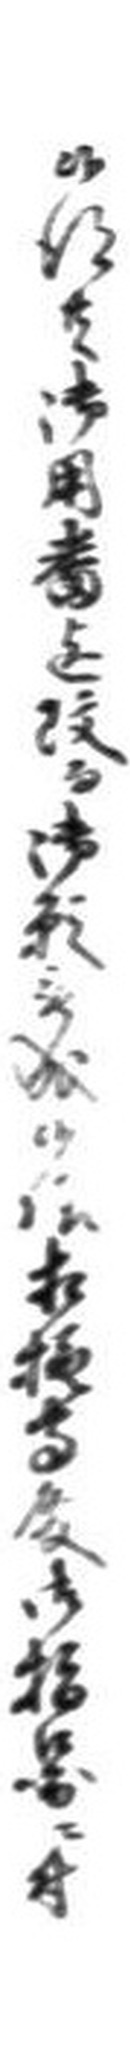候得共御用番迄改而御願被成候様相模守殿御指図ニ付
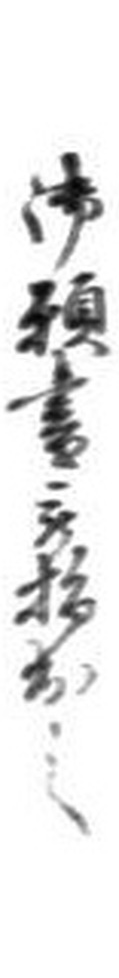御願書被指出之
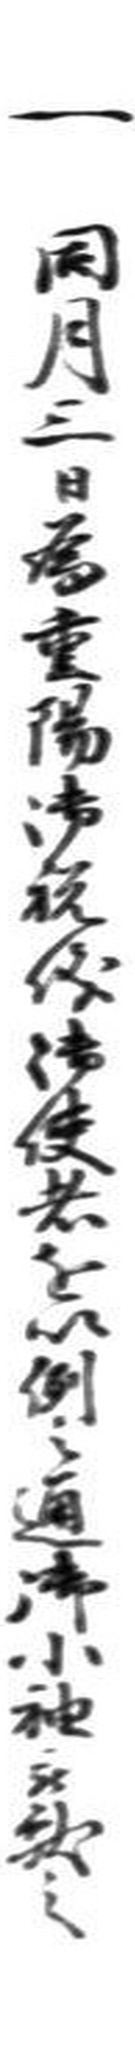一同月三日為重陽御祝儀御使者を以例之通御小袖被献之
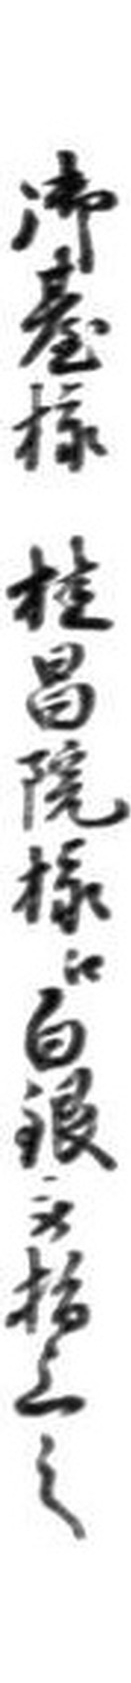御臺様桂昌院様江白銀被指上之
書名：家譜 二十一 吉品公 従元禄十三年到同十四年
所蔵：福井県文書館 Fukui Prefectural Archives
